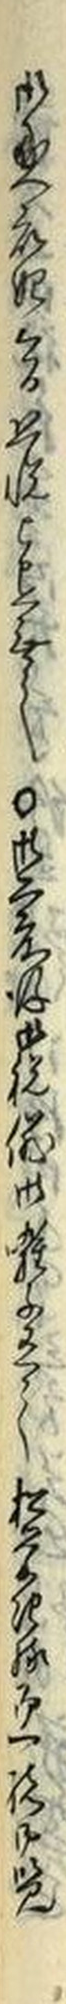御用人衆始今日恐悦被申上無之〇御二度後御祝儀御囃子有之松栄院様御一緒御覧
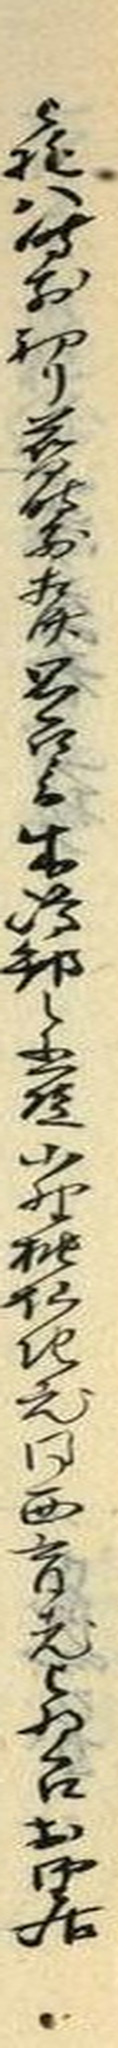被遊八時前初り暮時前相済思召ニ而成嶋邦之丞殿小野桃仙院老同西育老被為召於御居
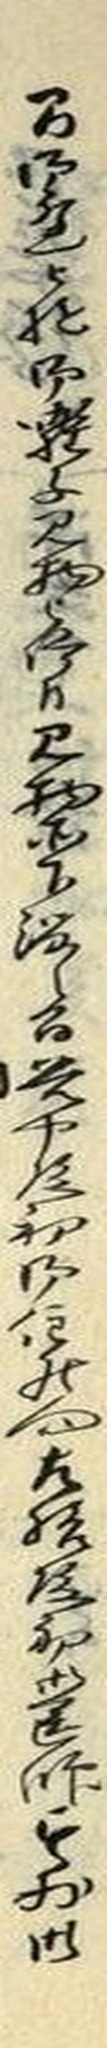間御逢被遊御囃子見物被仰付見物所下溜之間谷中殿初御住居向左膳殿初御医師其外御
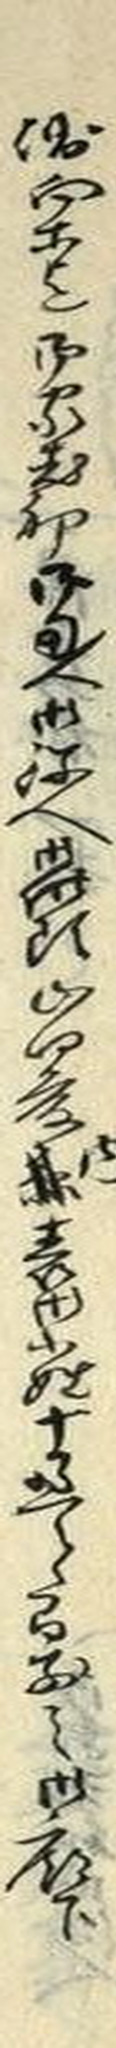側向等迄御家老初御用人御役人御供頭山田藤内表御小姓十畳之間前之御廊下
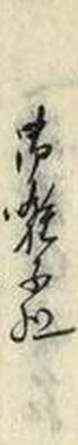御囃子組
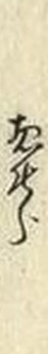源次郎
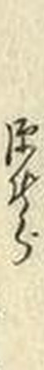源次郎
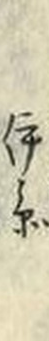久兵衛
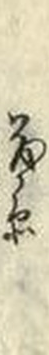久兵衛
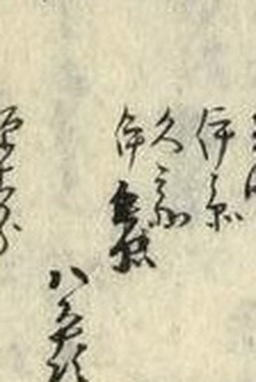久兵衛
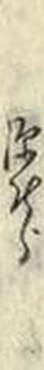源次郎
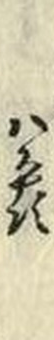八平次
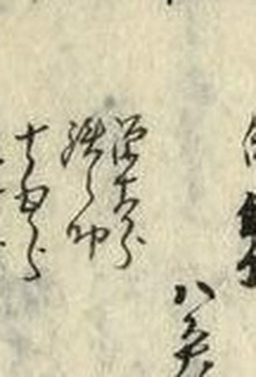源次郎
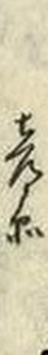久兵衛
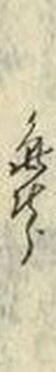亀次郎
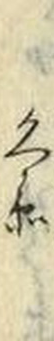久兵衛
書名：少傅日録抄（斉善付側向頭取日記、在府）
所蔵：福井県文書館 Fukui Prefectural Archives
